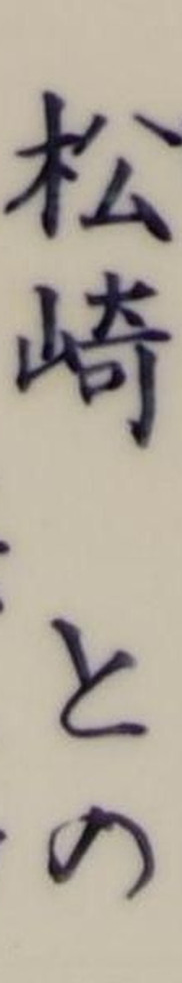松崎との
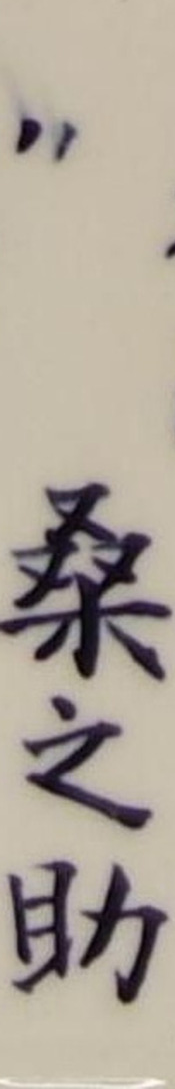桑之助
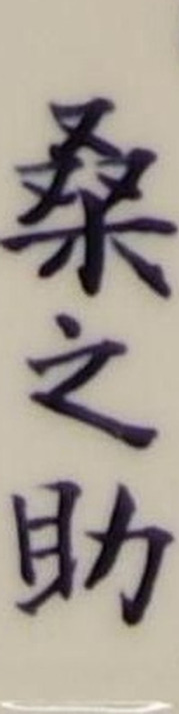桑之助
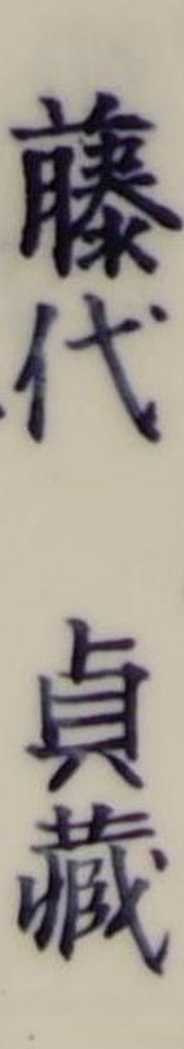藤代貞蔵
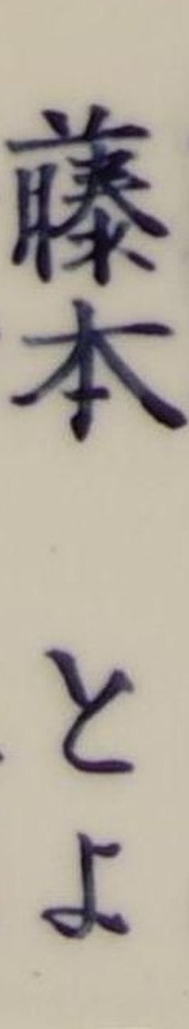藤本とよ
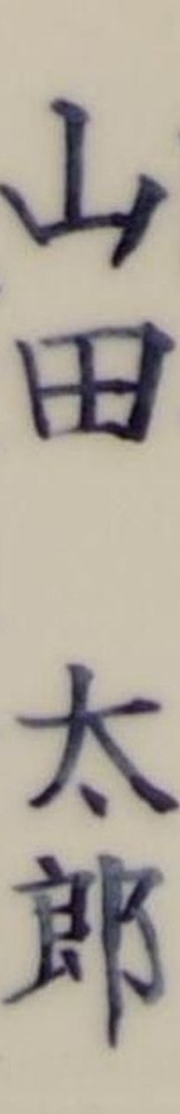山田太郎
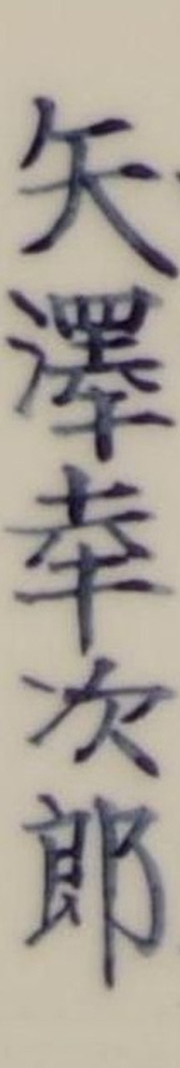矢澤幸次郎
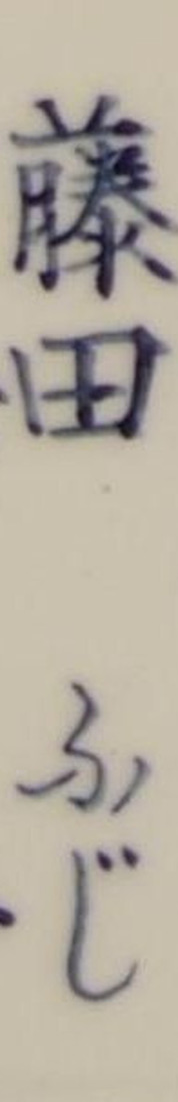藤田ふじ
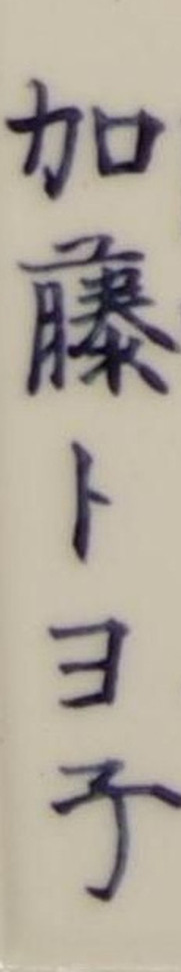加藤トヨ子

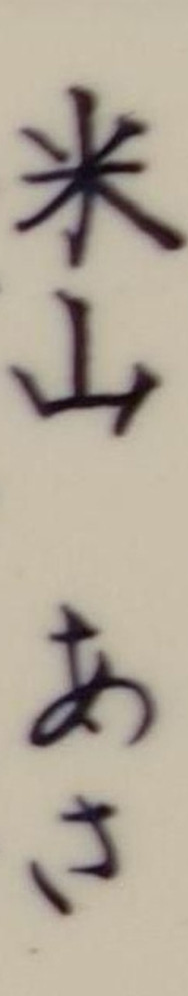米山あさ
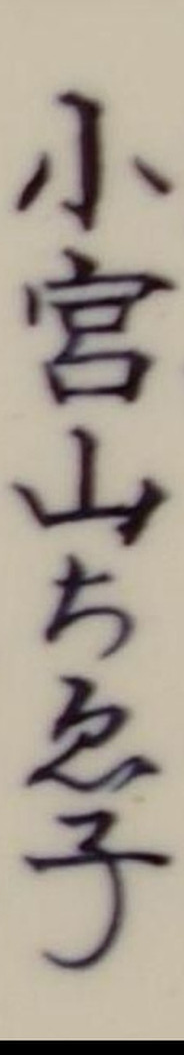小宮山ちゑ子
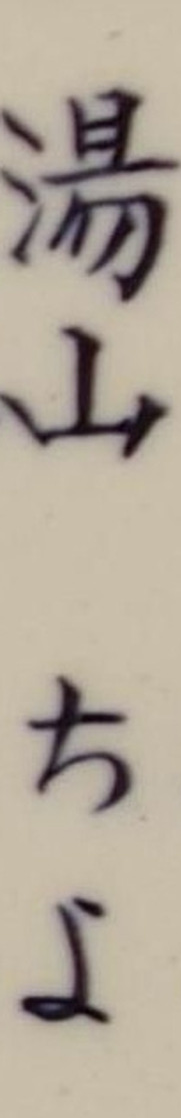湯山ちよ
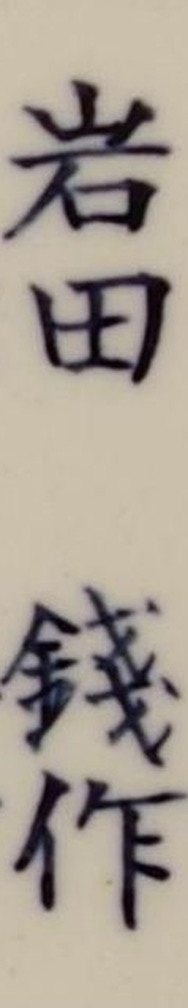岩田銭作
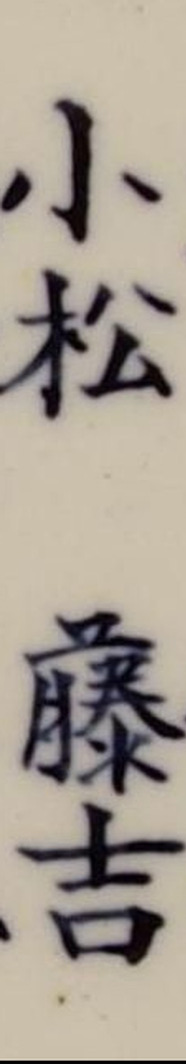小松藤吉
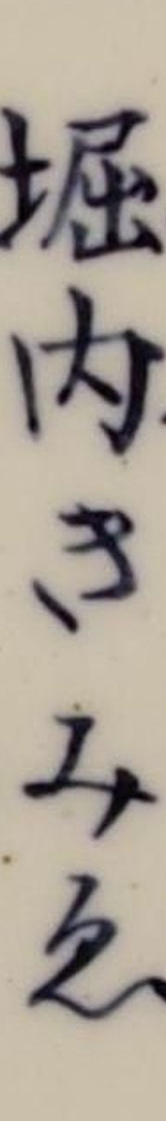堀内きみゑ
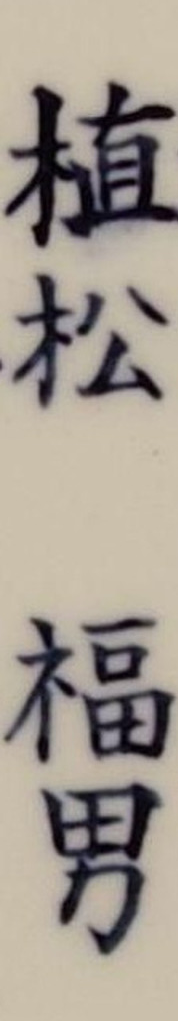植松福男
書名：E~L
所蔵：高野山金剛峯寺
